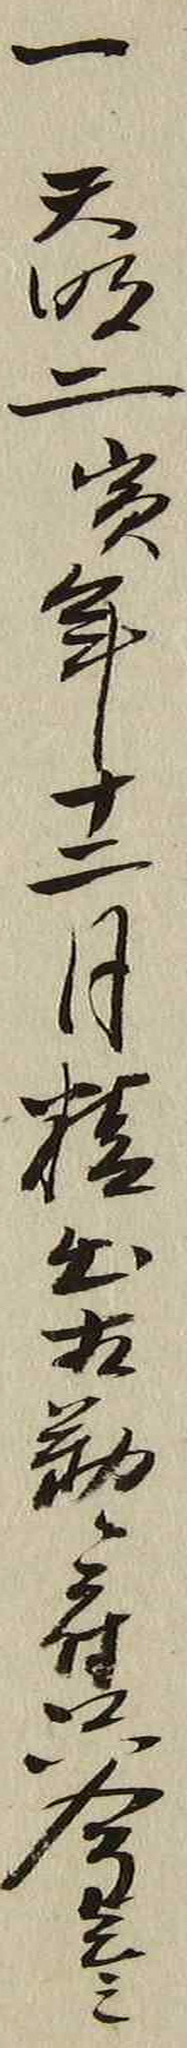一天明二寅年十二月精出相勤候付只今迄之
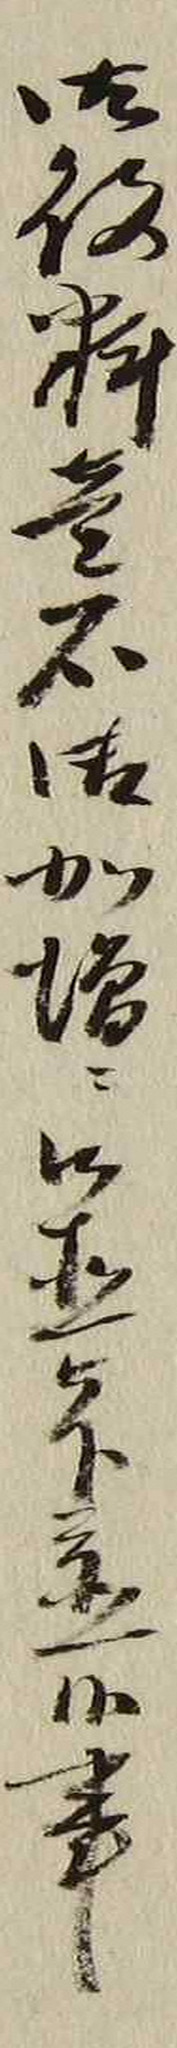御役料壱石御加増御直被下置候事
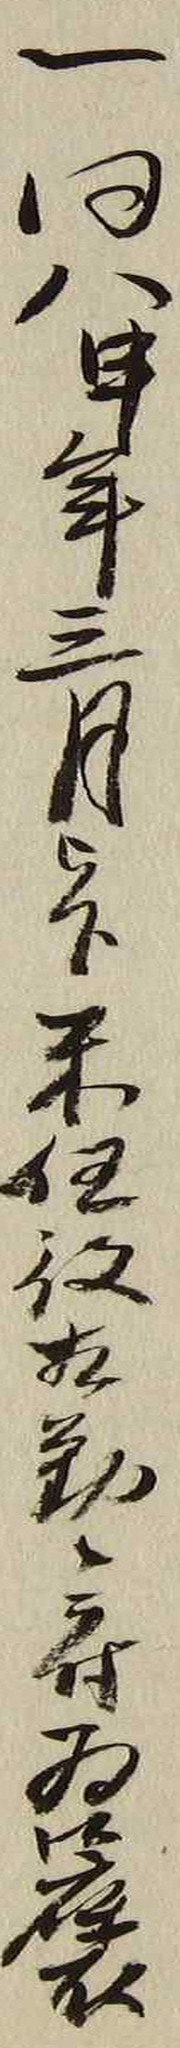一同八申年三月被下米任役相勤候付為御褒
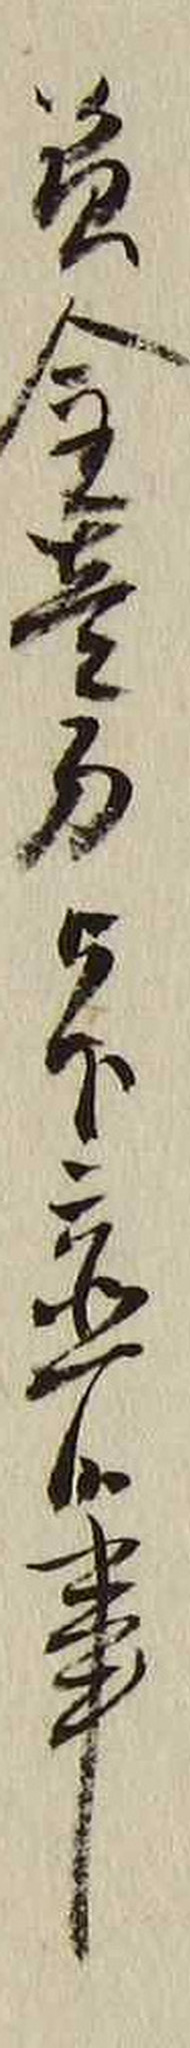美金壱分被下置候事
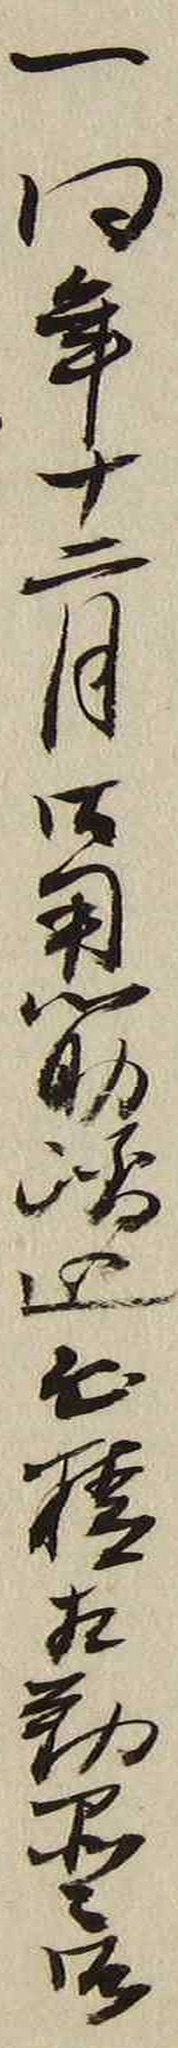一同年十二月御用筋踏込出精相勤品々御
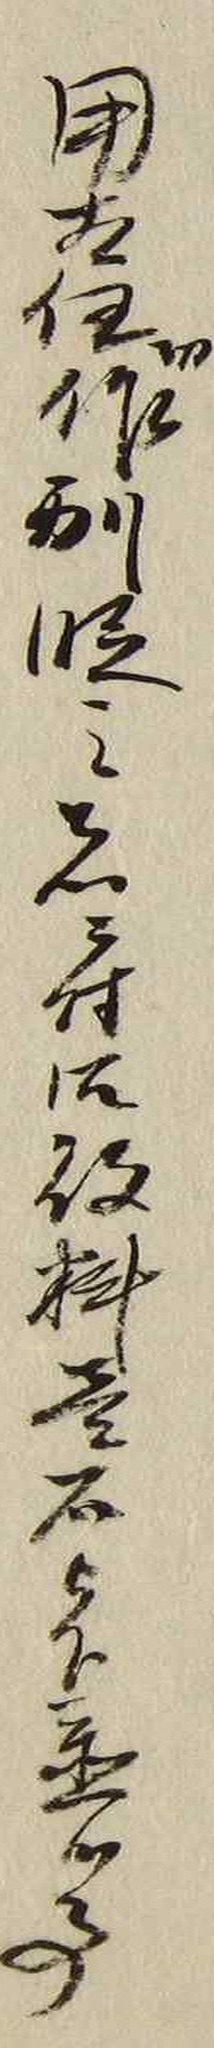用相任功作別段之者付御役料壱石被下置候事

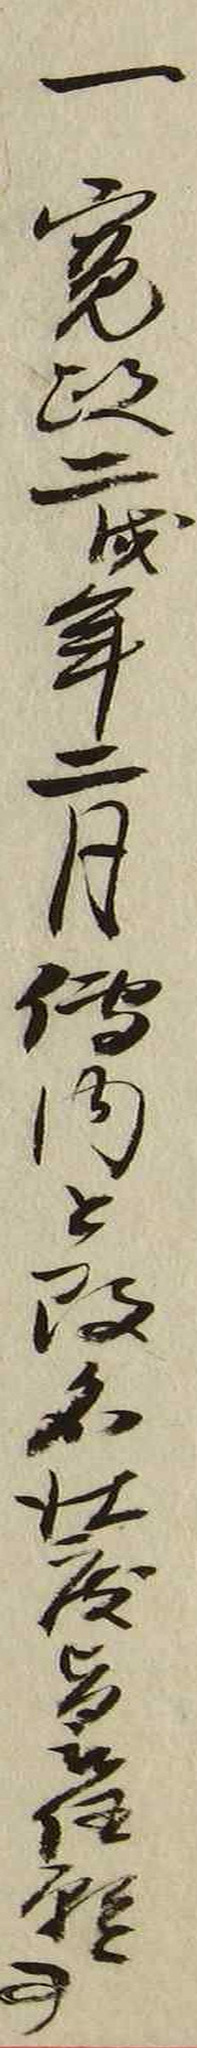一寛政二戌年二月伝内と改名仕度旨被任願事
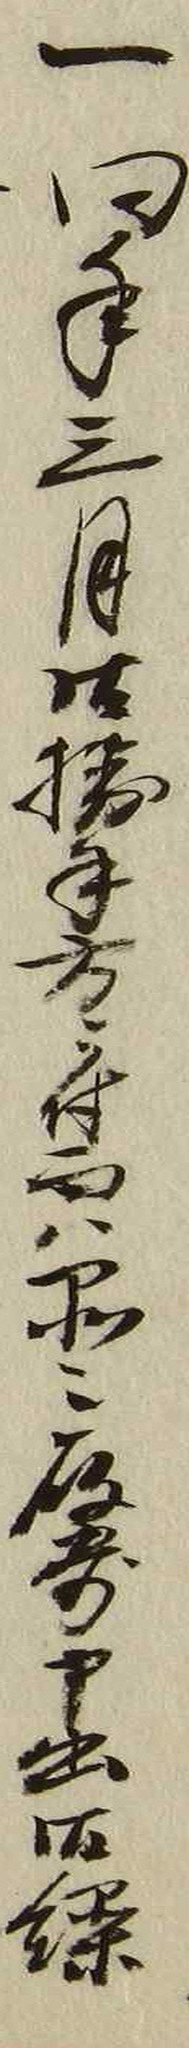一同年三月御勝手方付而ハ品々取寄申出御繰
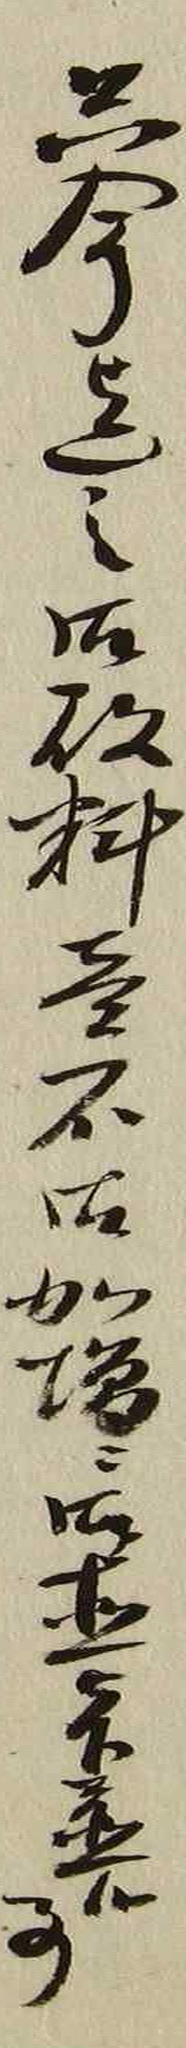只今迄之御役料壱石御加増御直被下置候事
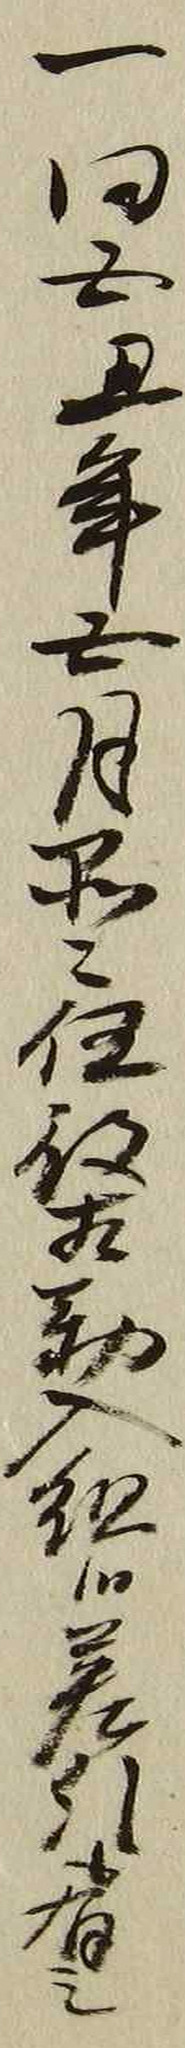一同五丑年五月品々任役相勤入組候差引も有之
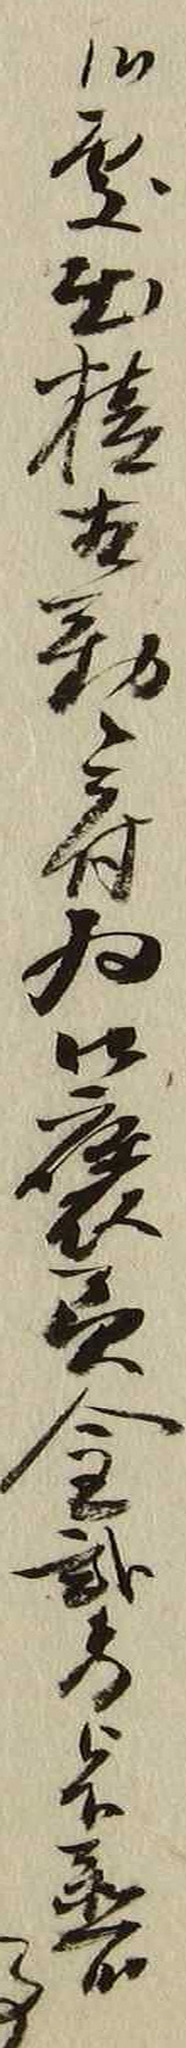候処出精相勤候付為御褒美金弐分被下置候事
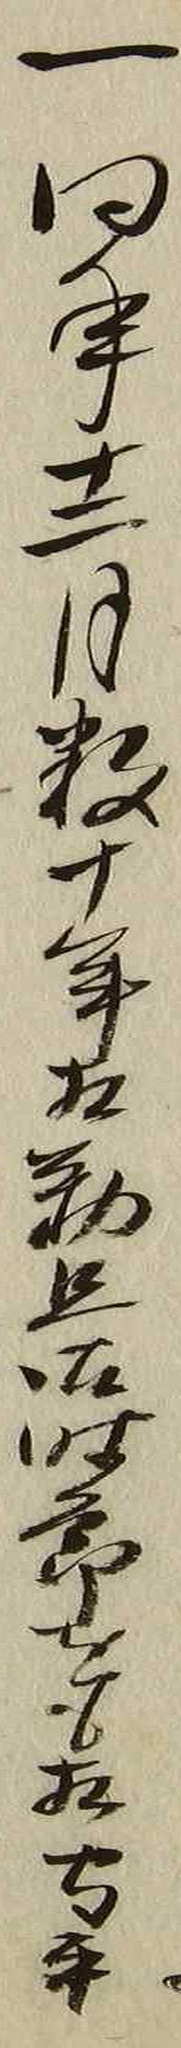一同年十二月数十年相勤且御時節をも相守平
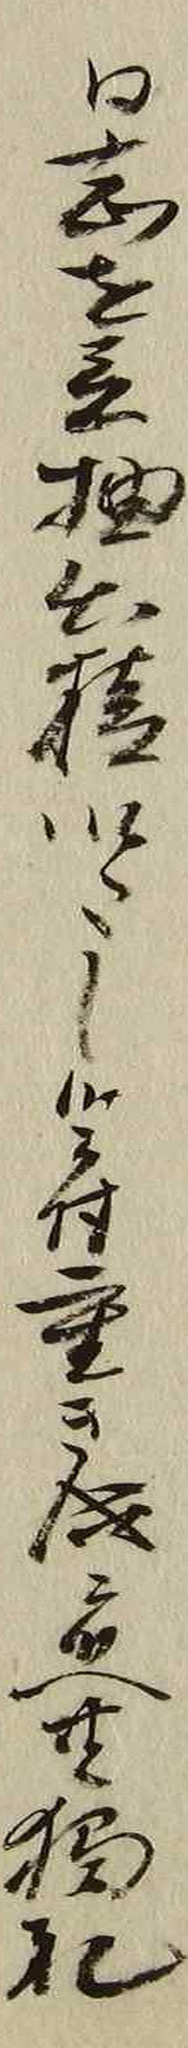日志を立抽出精いたし候付重き義候へ共独礼
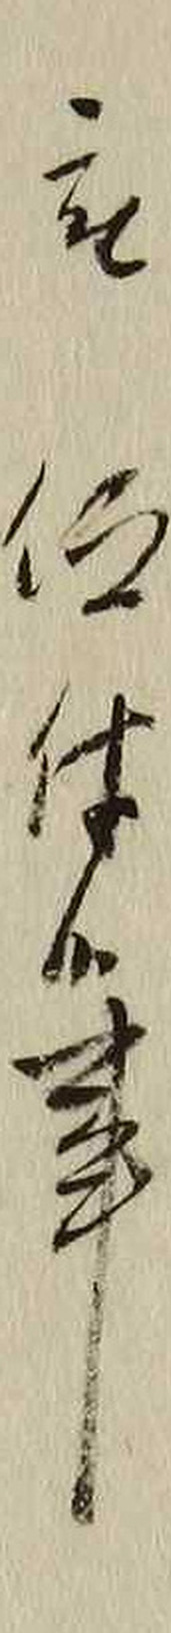被仰付候事
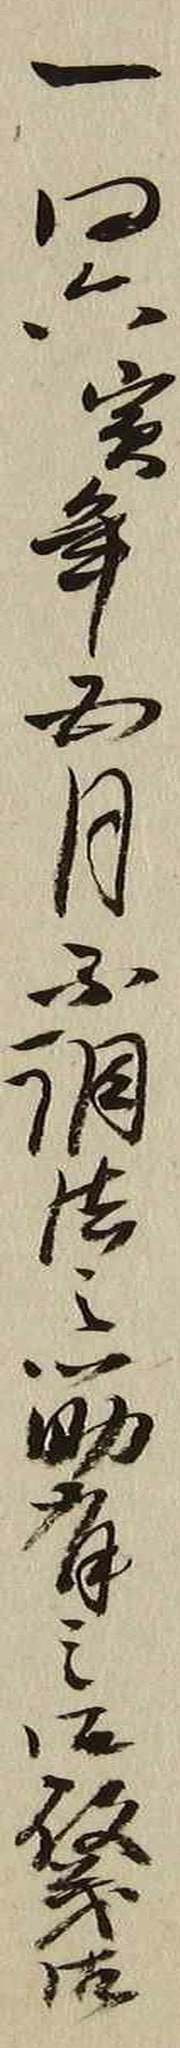一同六寅年五月不調法之筋有之御役義御
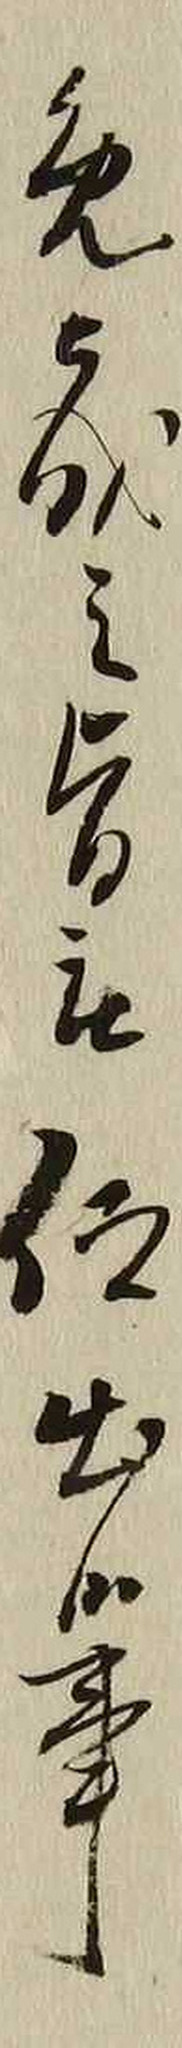免被成之旨被仰出候事
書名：諸士系譜　巻之350　せ之部1冊全
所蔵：会津若松市立会津図書館
